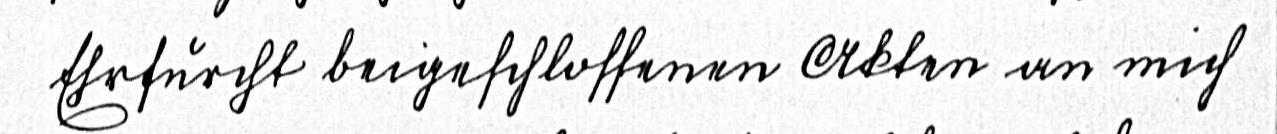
Ehrfurcht beigeschlossenen Akten an mich
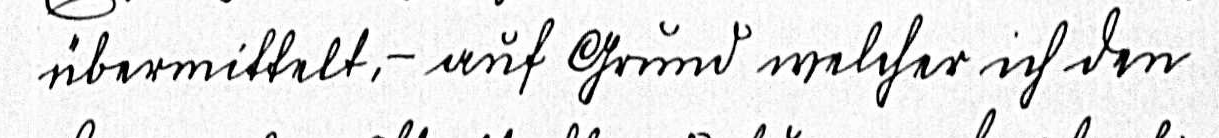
übermittelt, – auf Grund welcher ich den
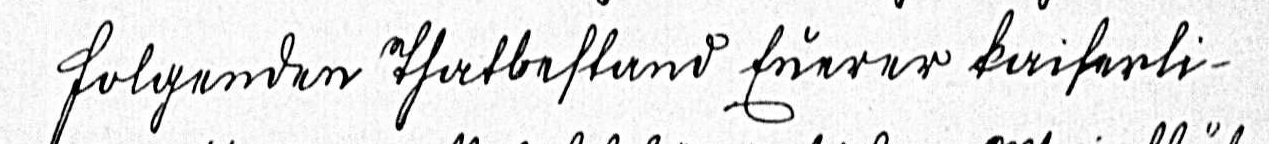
folgenden Thatbestand Euerer kaiserli¬
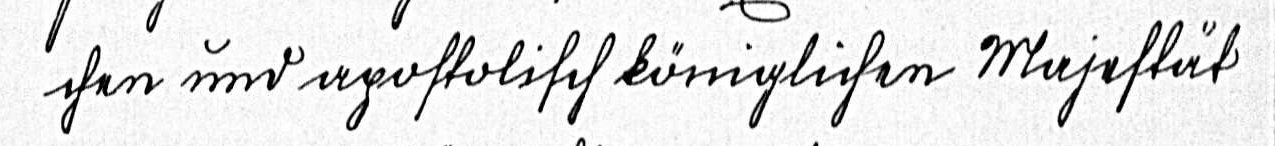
chen und apostolisch königlichen Majestät
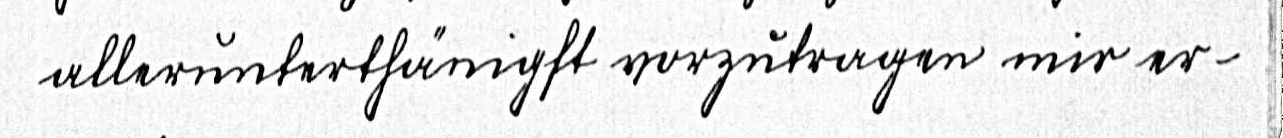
allerunterthänigst vorzutragen mir er¬
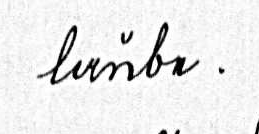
laube.
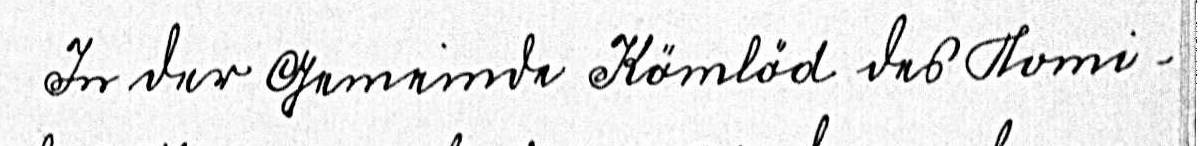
In der Gemeinde Kőmlőd des Komi¬
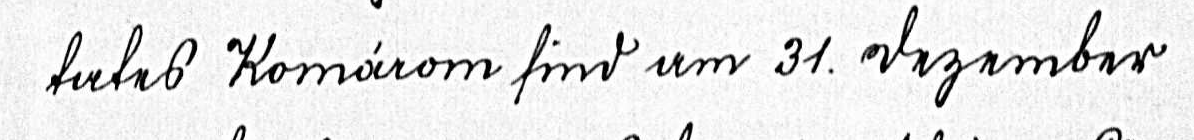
tates Komárom sind am 31. Dezember
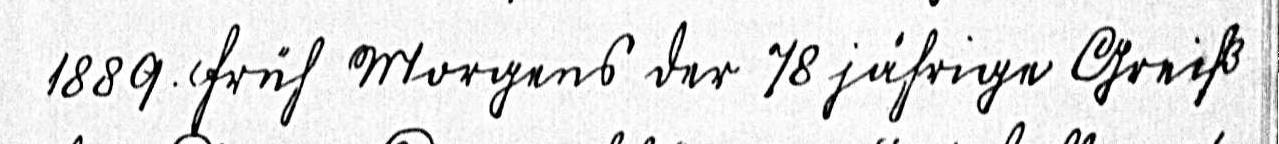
1889 früh Morgens der 78jährige Greiß¬
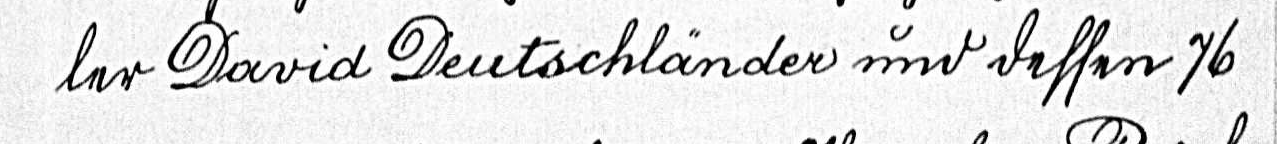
ler David Deutschländer und dessen 76
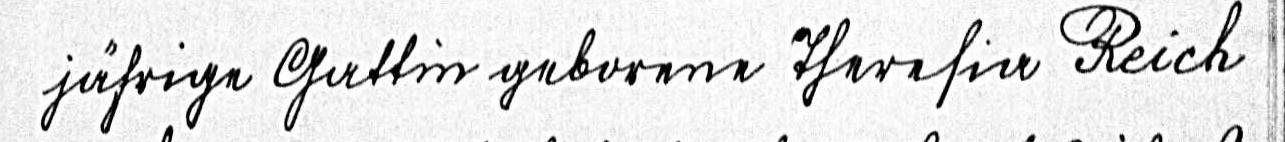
jährige Gattin geborene Theresia Reich
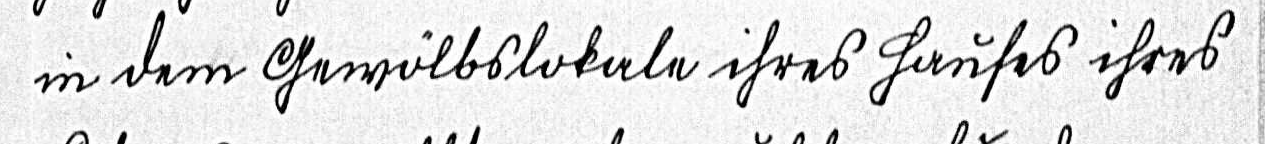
in dem Gewölbslokale ihres Hauses ihres
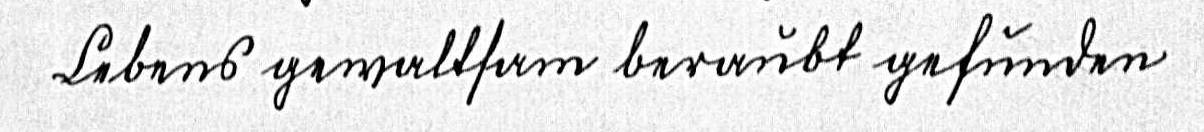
Lebens gewaltsam beraubt gefunden
